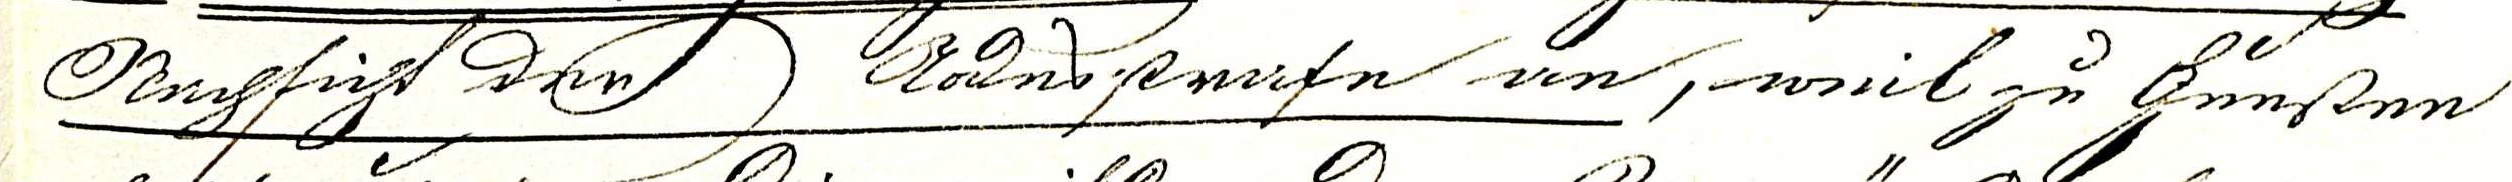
Nachsicht der Todesstrafe an, weil zu Gunsten
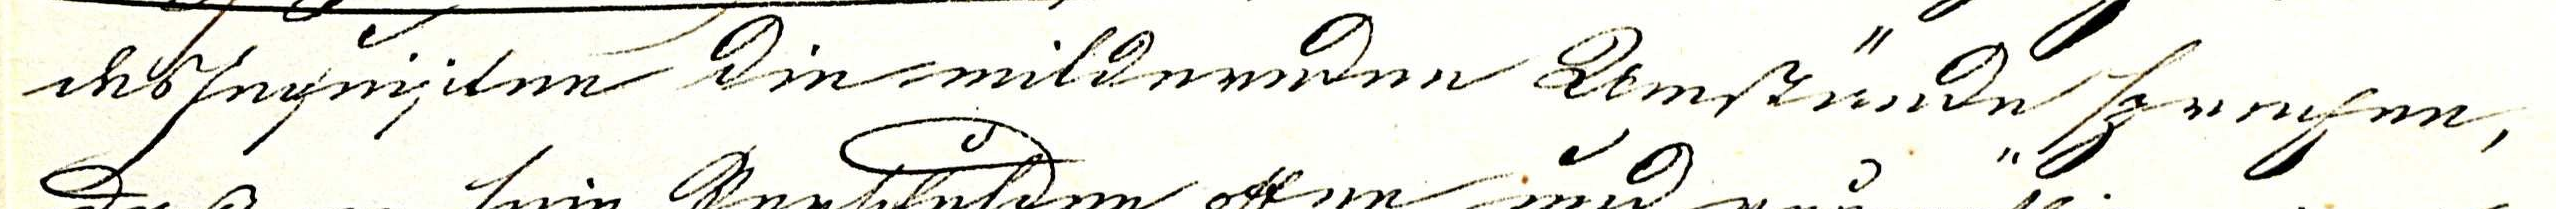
des Inquisiten die mildernden Umstände sprachen,
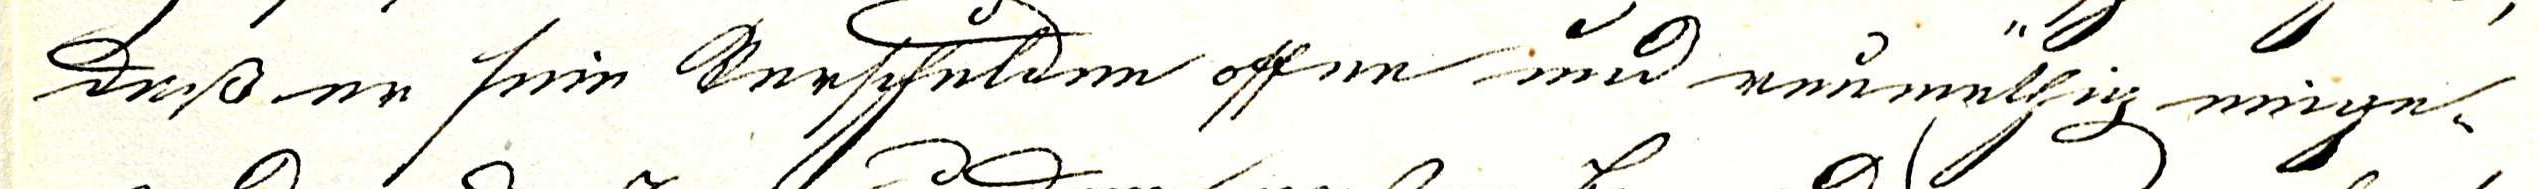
daß er sein Verschulden offen und reumüthig einge¬
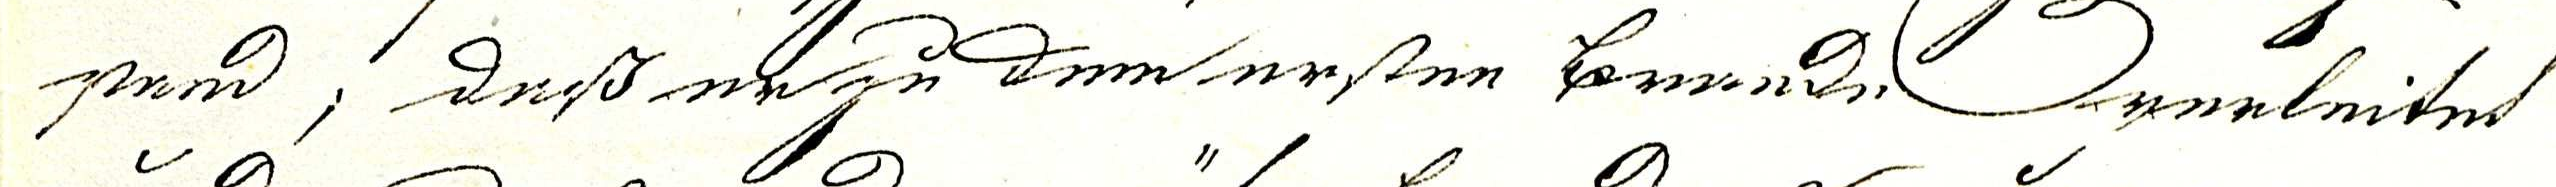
stand; daß er zu dem ersten Brande verleitet
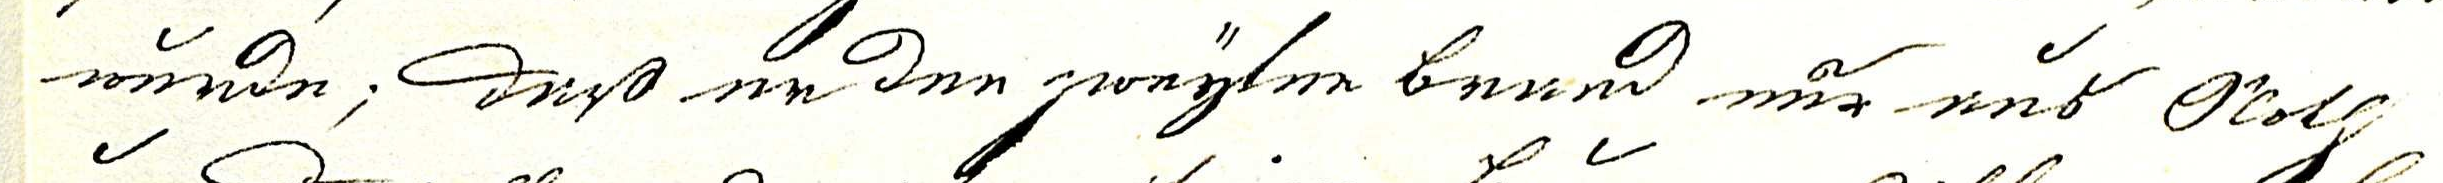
wurde; daß er den zweyten Brand nur aus Noth
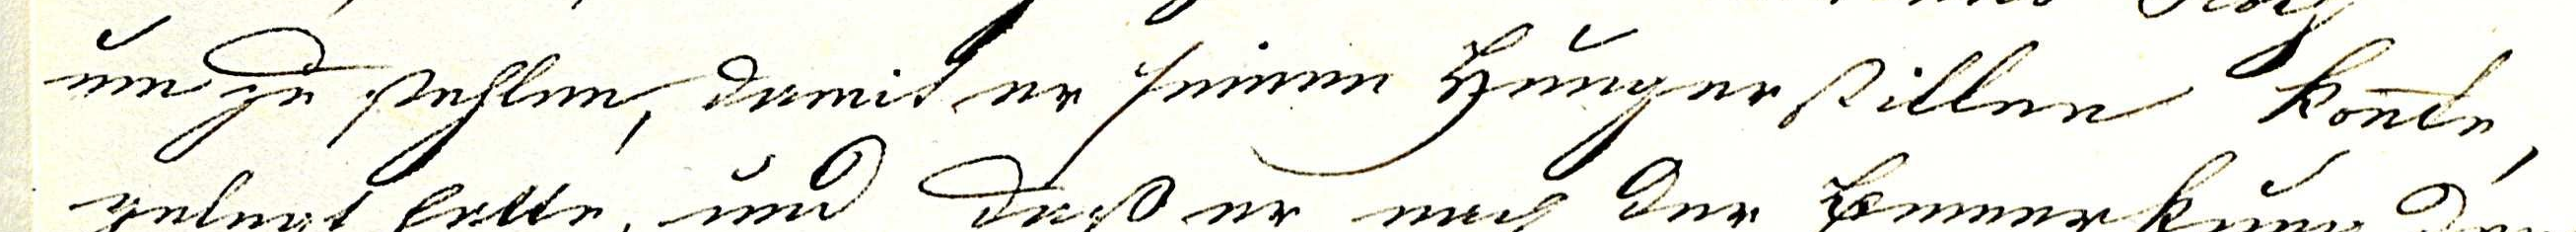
um zu stehlen, damit er seinen Hunger stillen konnte,
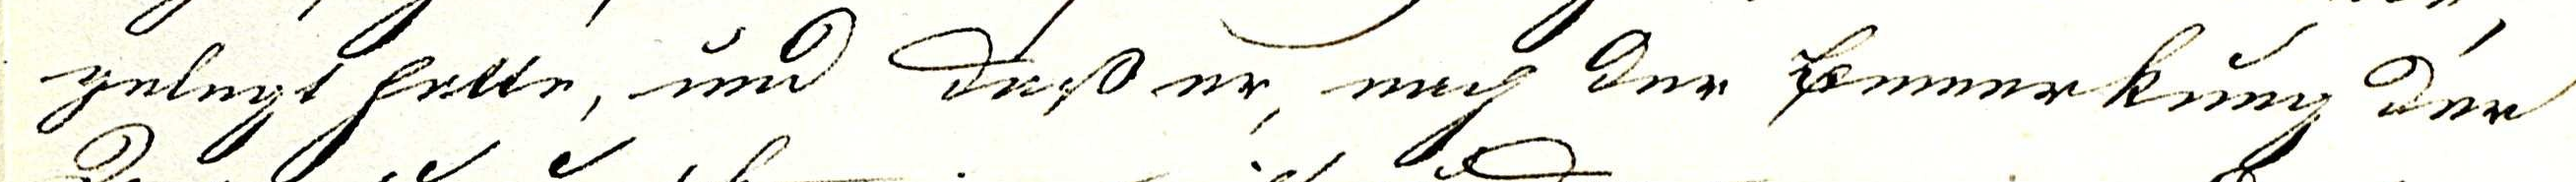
gelegt hatte, und daß er, nach der Bemerkung der
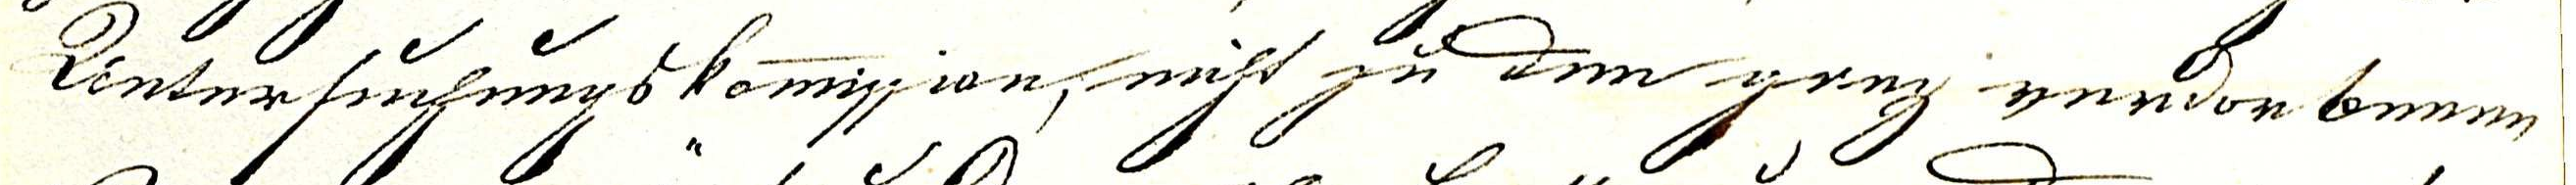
Untersuchungskommission, nicht zu dem ganz verdorbenen
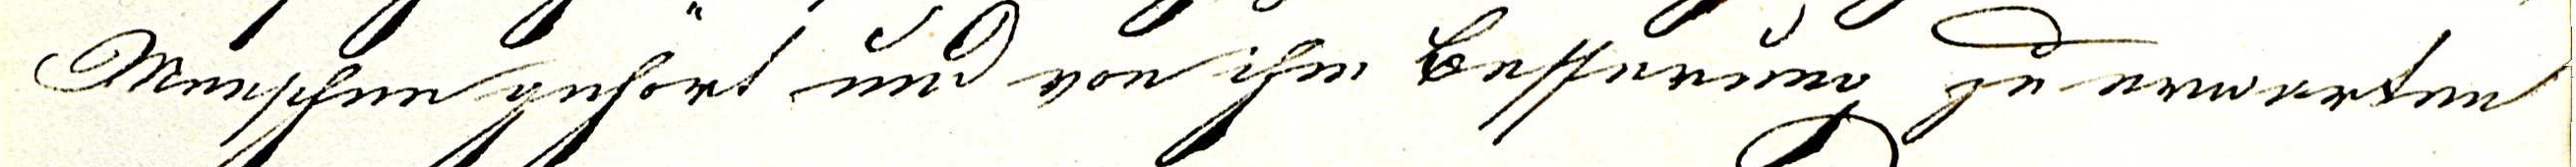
Menschen gehört und von ihm Besserung zu erwarten
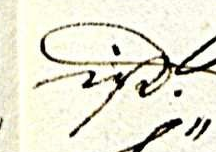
ist.
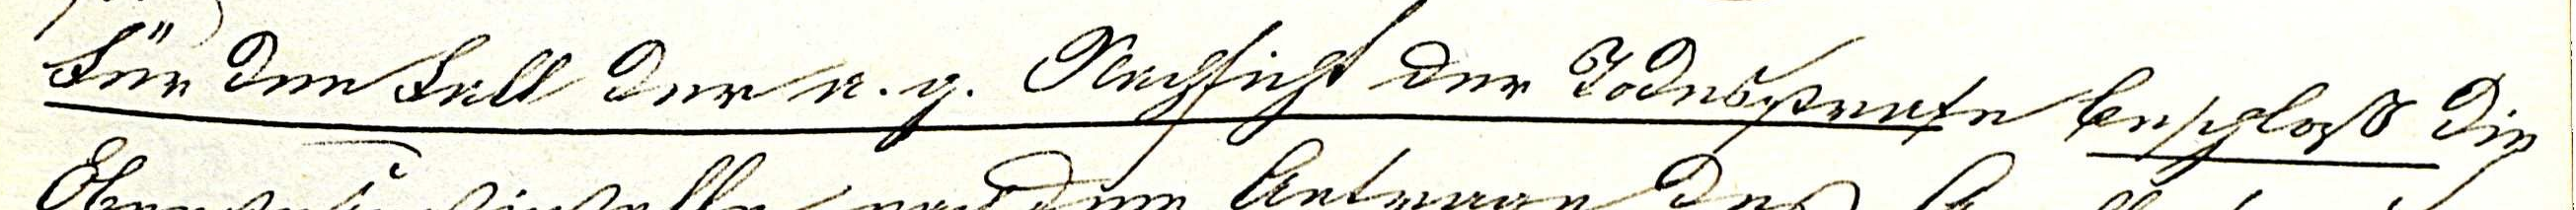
Für den Fall der a.g. Nachsicht der Todesstrafe beschloß die
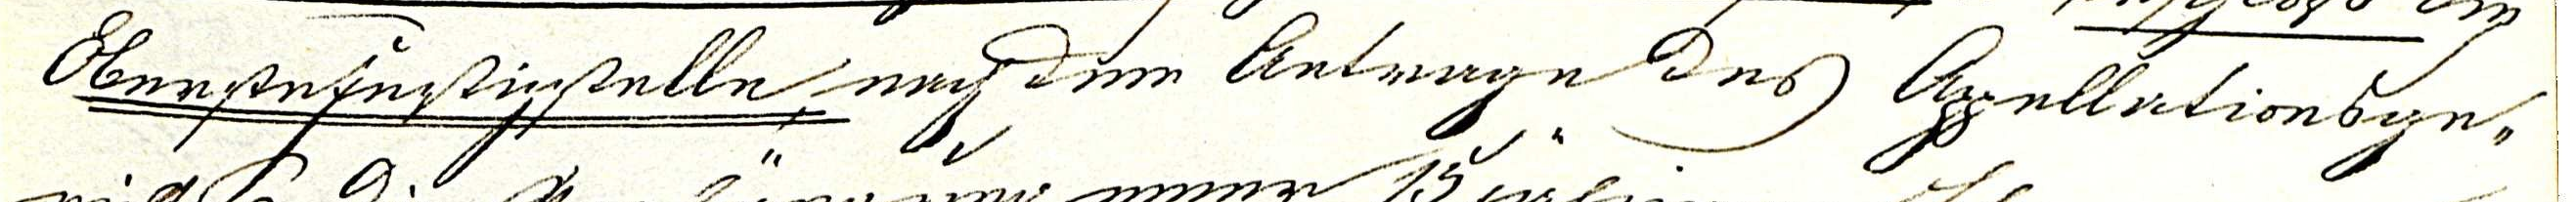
Oberste Justizstelle nach dem Antrage des Appellationsge¬
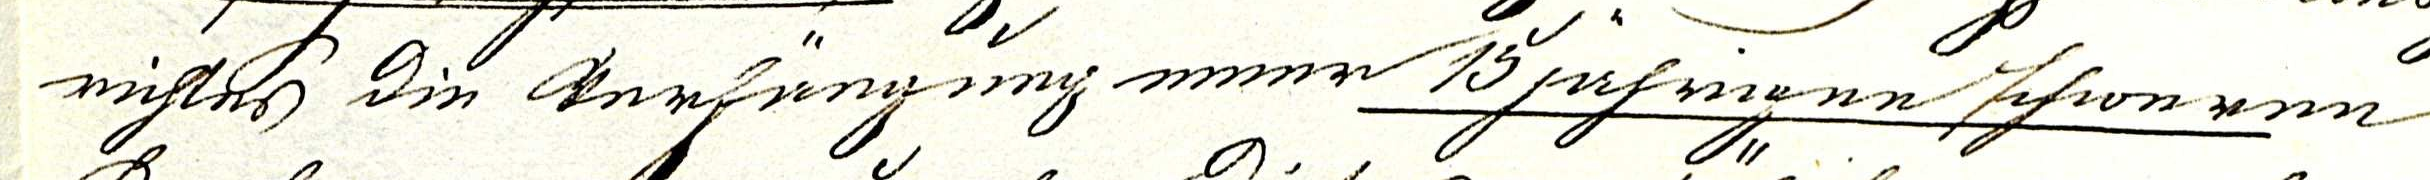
richtes die Verhängung einer 15jährigen schweren
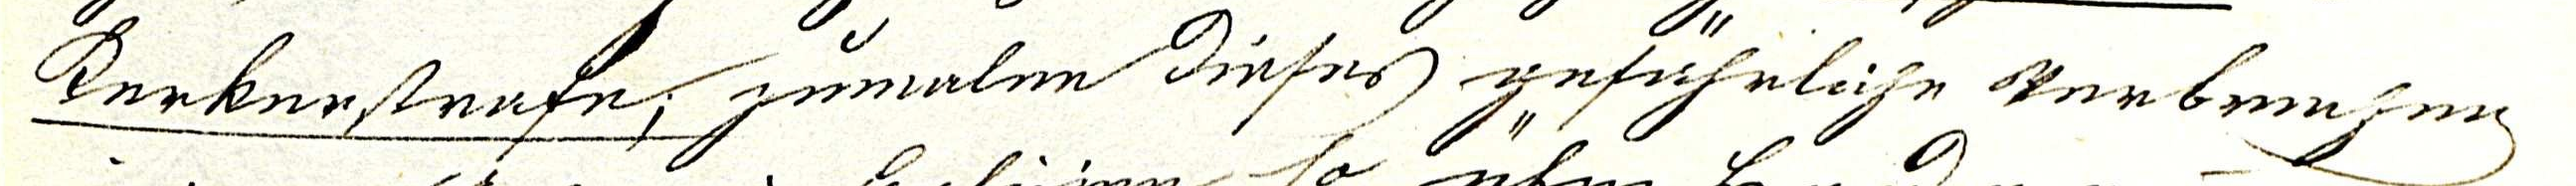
Kerkerstrafe; zumalen dieses gefährliche Verbrechen
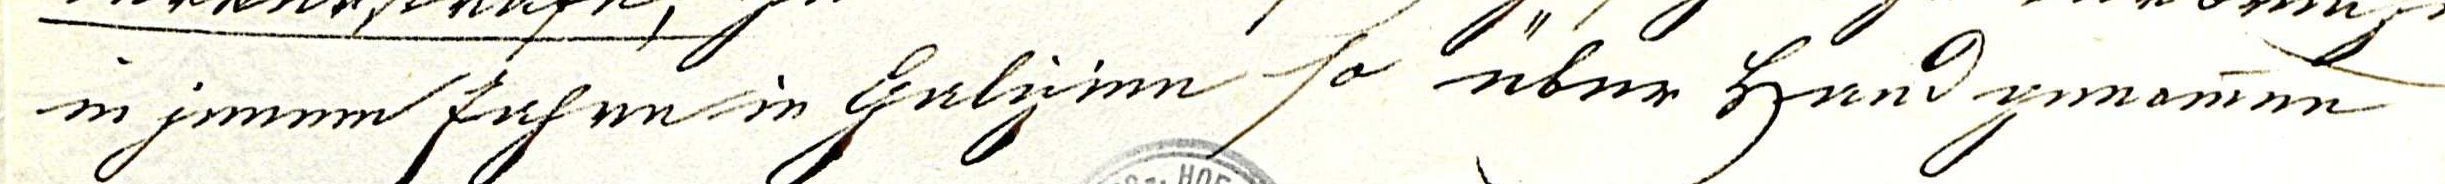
in jenem Jahre in Galizien so über Hand genommen
